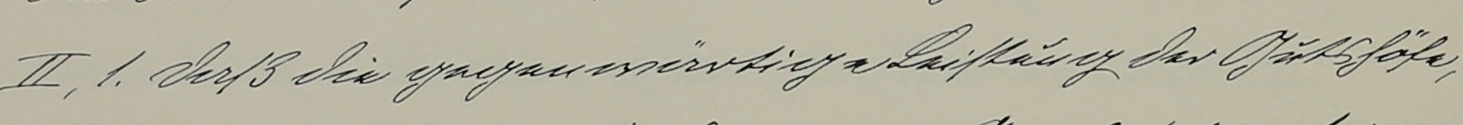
II.1. daß die gegenwärtige Leistung der Gutshöfe,
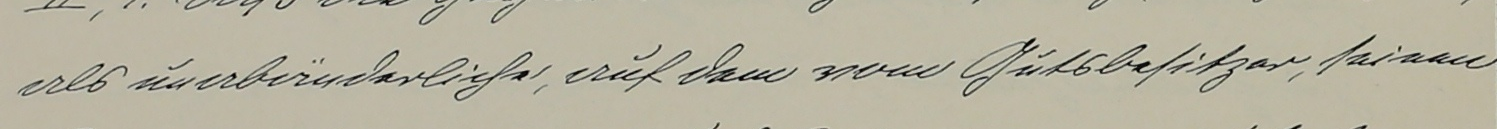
als unabänderliche, auf dem vom Gutsbesitzer, seinen
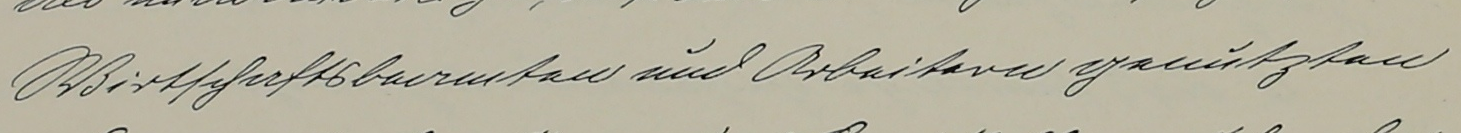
Wirtschaftsbeamten und Arbeitern genutzten
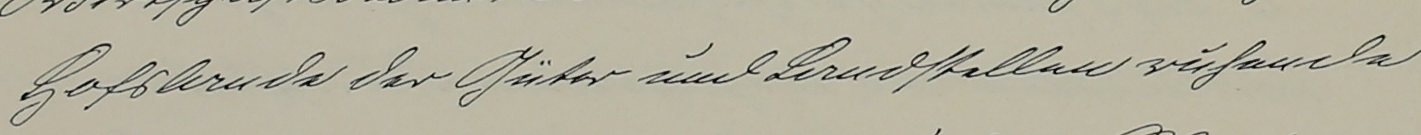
Hofslande der Güter und Landstellen ruhende
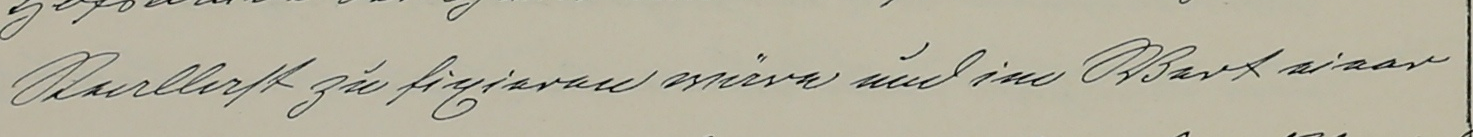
Reallast zu fixieren wäre und im Wert einer
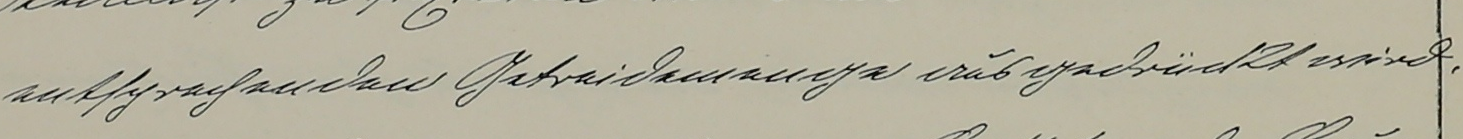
entsprechenden Getreidemenge ausgedrückt wird.
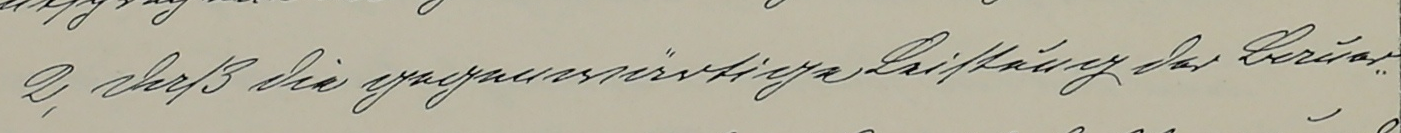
2. daß die gegenwärtige Leistung der Bauer-
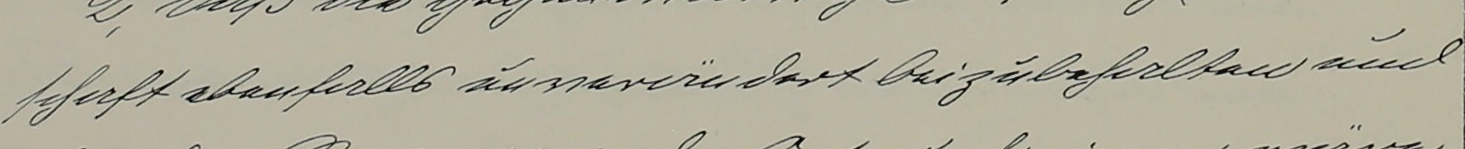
schaft ebenfalls unverändert beizubehalten und
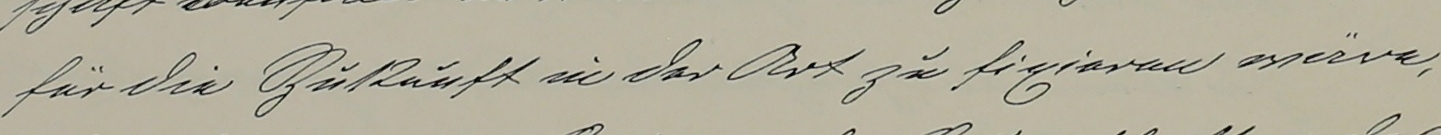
für die Zukunft in der Art zu fixieren wäre,
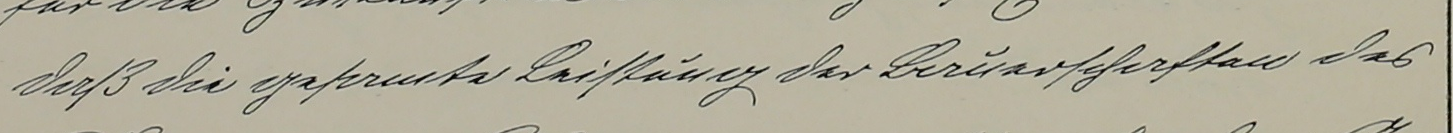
daß die gesamte Leistung der Bauerschaften des
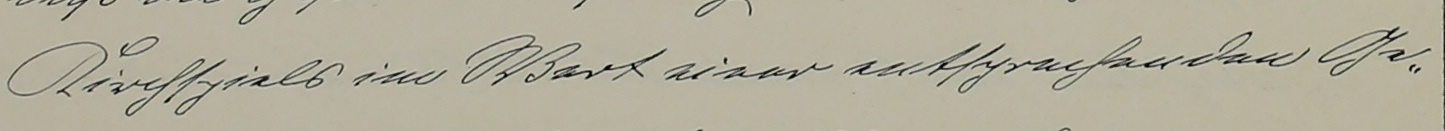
Kirchspiels im Wert einer entsprechenden Ge-
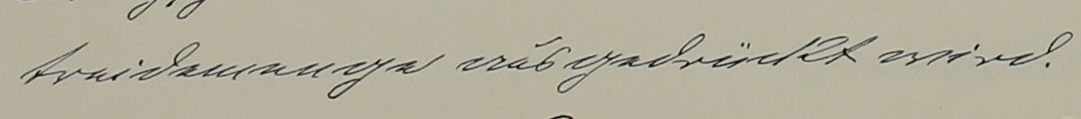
treidemenge ausgedrückt wird.
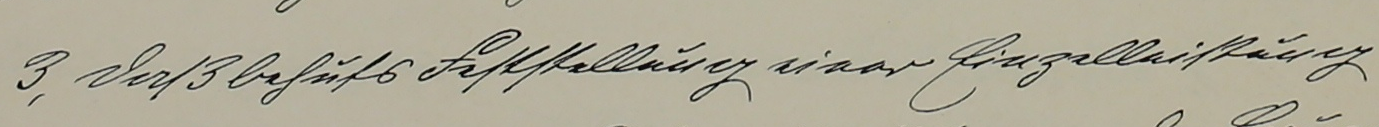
3. daß behufs Feststellung einer Einzelleistung
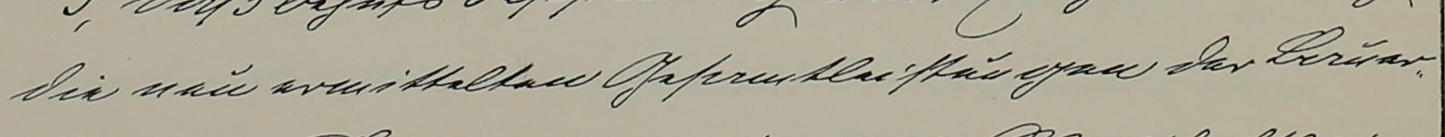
die neu ermittelten Gesamtleistungen der Bauer-
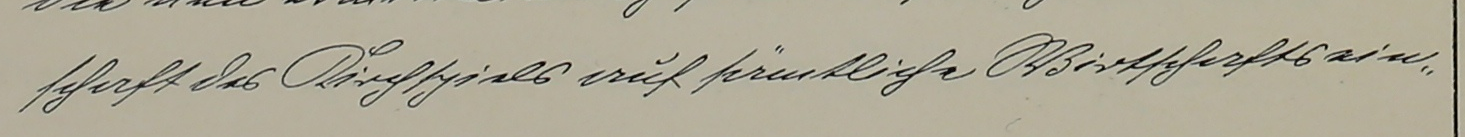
schaft des Kirchspiels auf sämtliche Wirtschaftsein-
